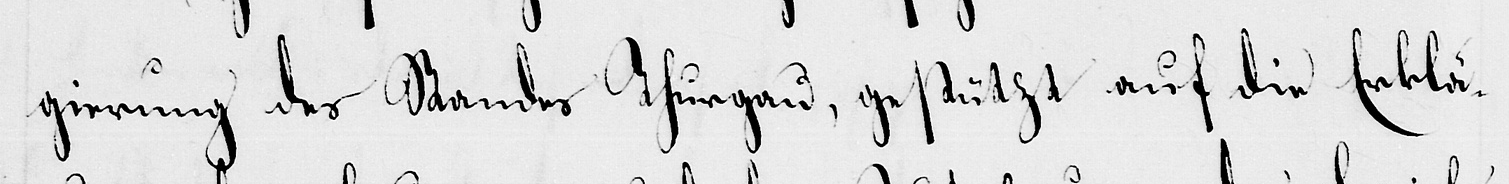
gierung des Standes Thurgau, gestützt auf die Erklä¬
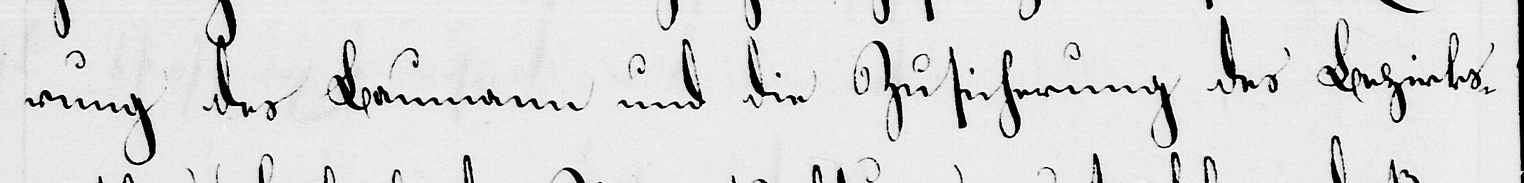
rung des Baumann und die Zusicherung des Bezirks¬
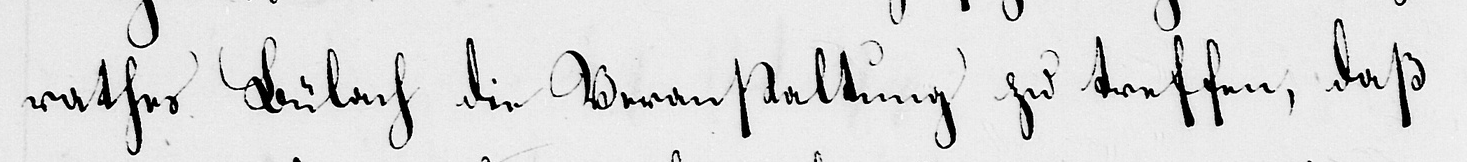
rathes Bülach die Veranstaltung zu treffen, daß
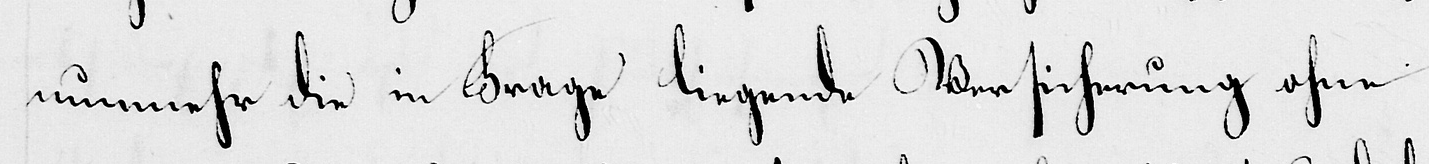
nunmehr die in Frage liegende Versicherung ohne
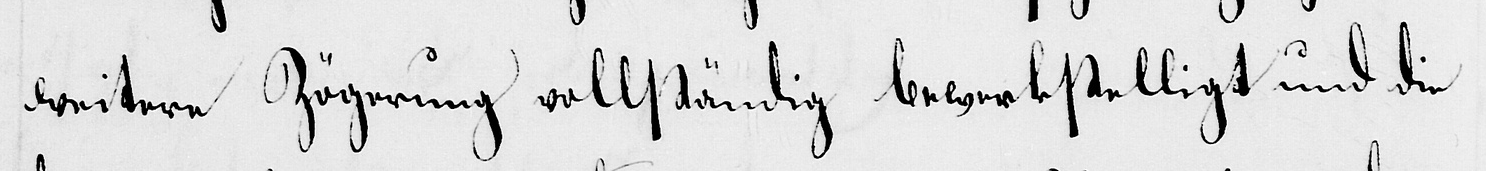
weitere Zögerung vollständig bewerkstelligt und die
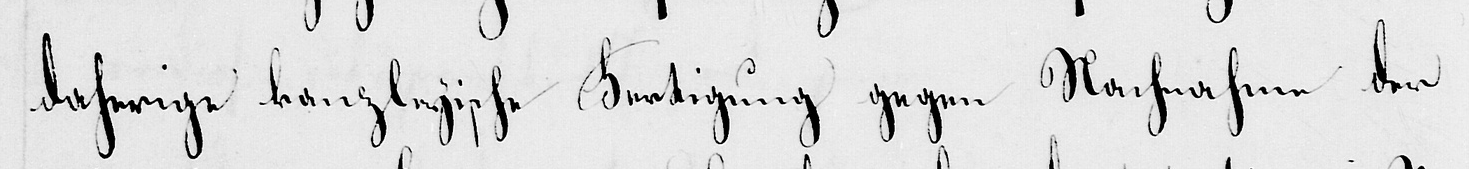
daherige kanzleyische Fertigung gegen Nachnahme der
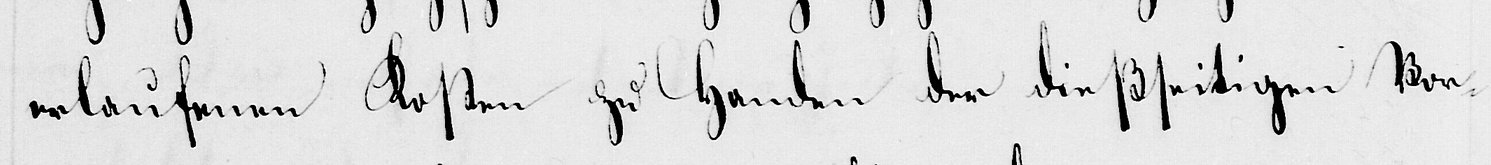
erlaufenen Kosten zu Handen der dießseitigen Vor¬
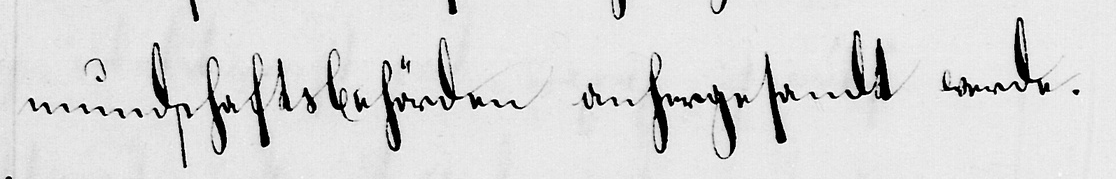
mundschaftsbehörden anhergesandt werde.
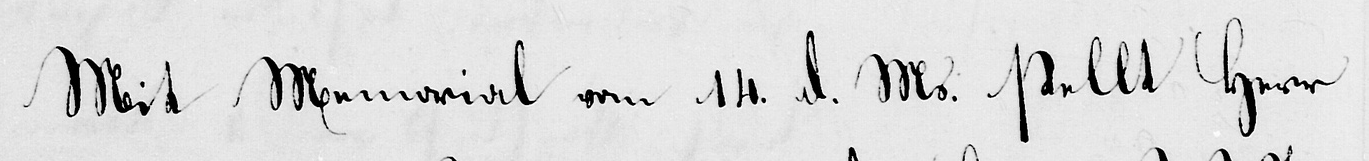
Mit Memorial vom 14. d. Ms. stellt Herr
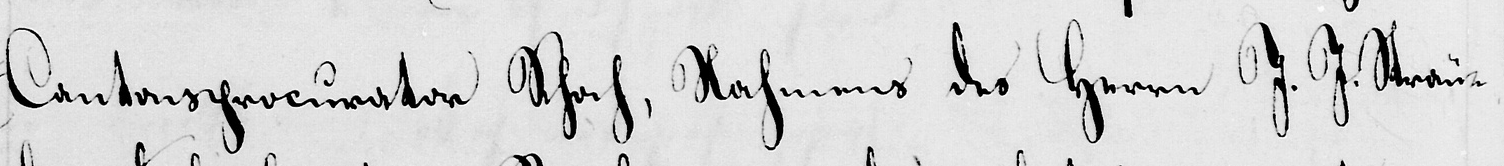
Cantonsprocurator Schoch, Nahmens des Herrn J. J. Sträu¬
